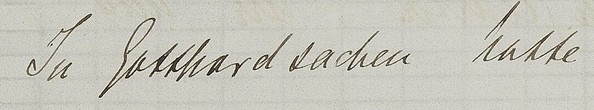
In Gotthardsachen hatte
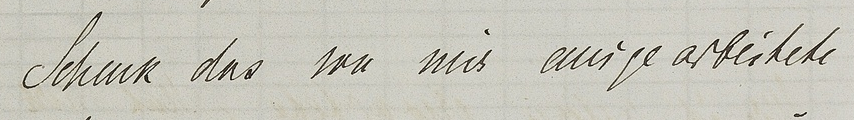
Schenk das von mir ausgearbeitete
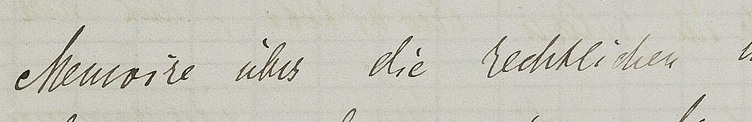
Memoire über die rechtlichen und
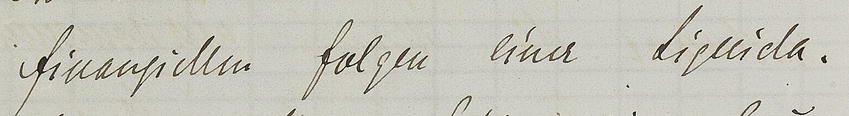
finanziellen Folgen einer Liquida-
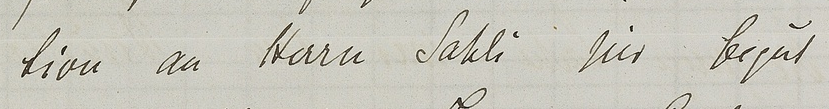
tion an Herrn Sahli zur Begut-
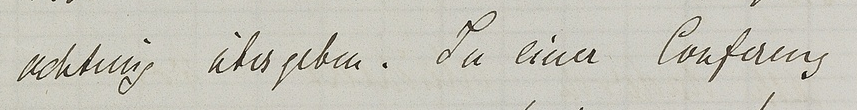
achtung übergeben. In einer Conferenz
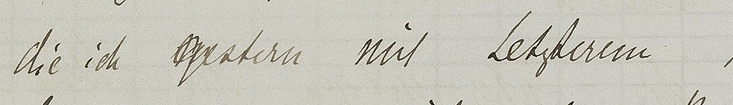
die ich gestern mit letzterem
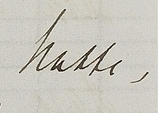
hatte,
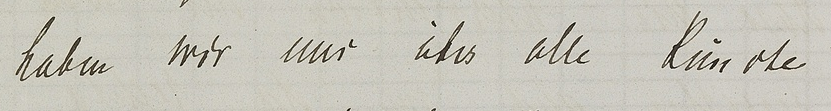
haben wir uns über alle Puncte
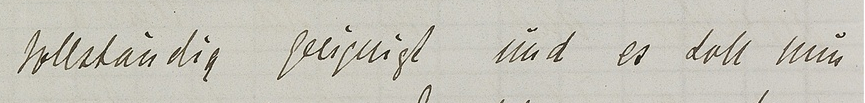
vollständig geeinigt und es soll nun
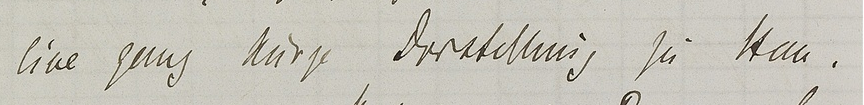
eine ganz kurze Darstellung zu Han-
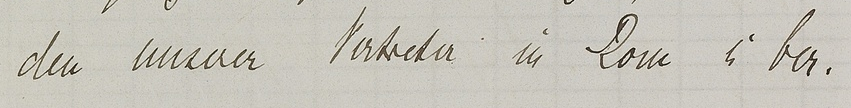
den unserer Vertreter in Rom u Ber-
